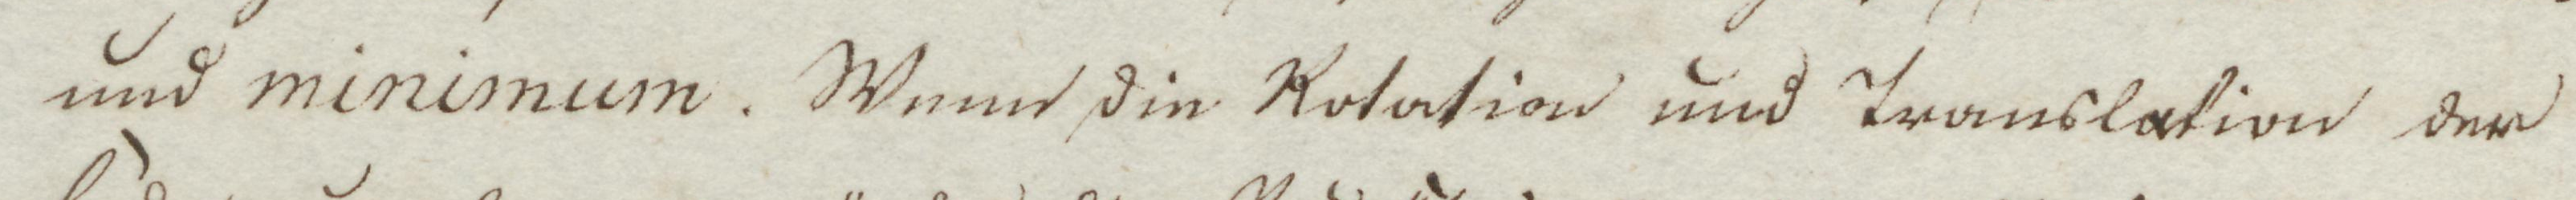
und minimum. Wenn die Rotation und Translation der
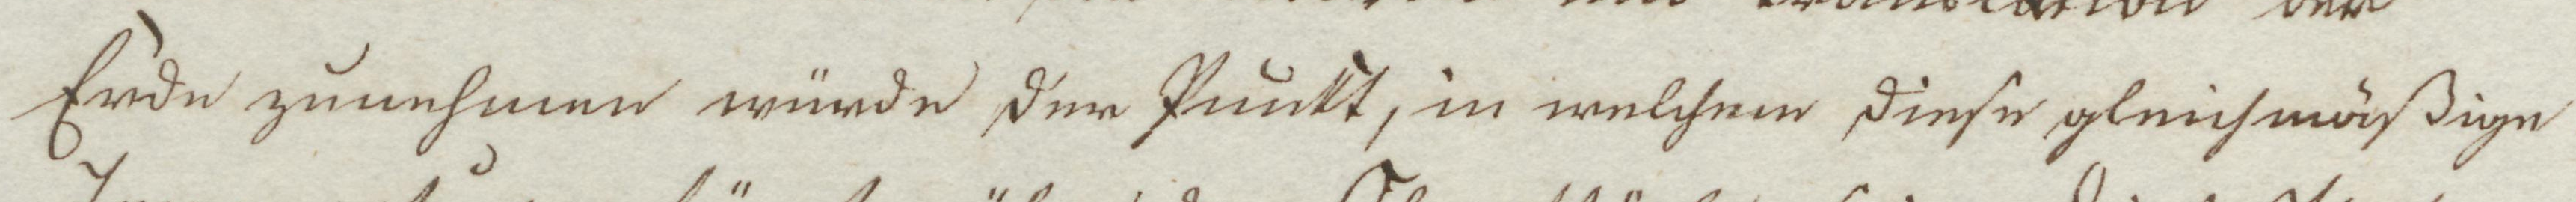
Erde zunehmen würde der Punkt, in welchem diese gleichmäßige
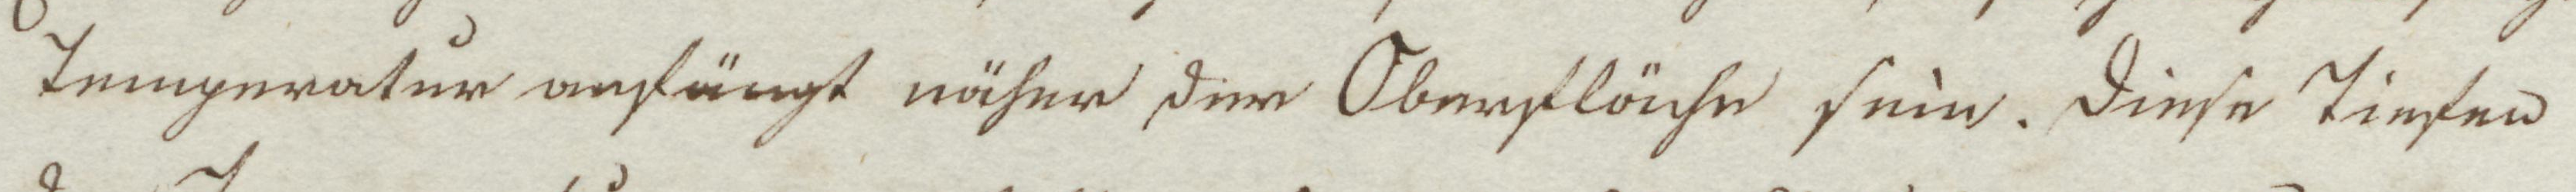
Temperatur anfängt näher der Oberfläche sein. Diese Tiefen
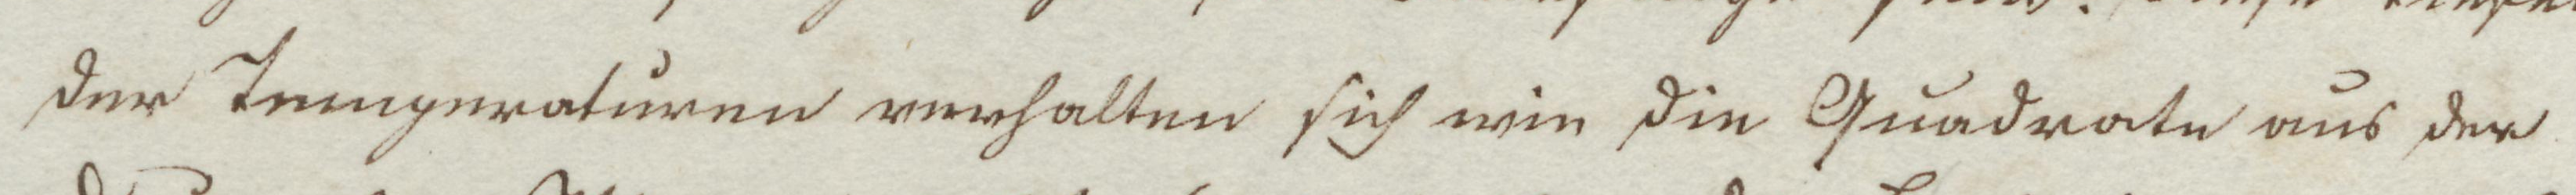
der Temperaturen verhalten sich wie die Quadrate aus der
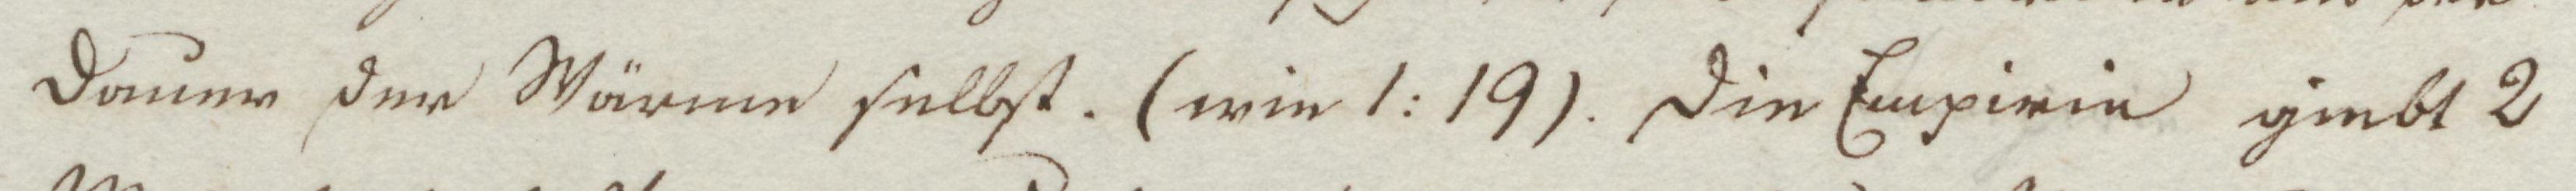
Dauer der Wärme selbst. . Die Empirie giebt 2
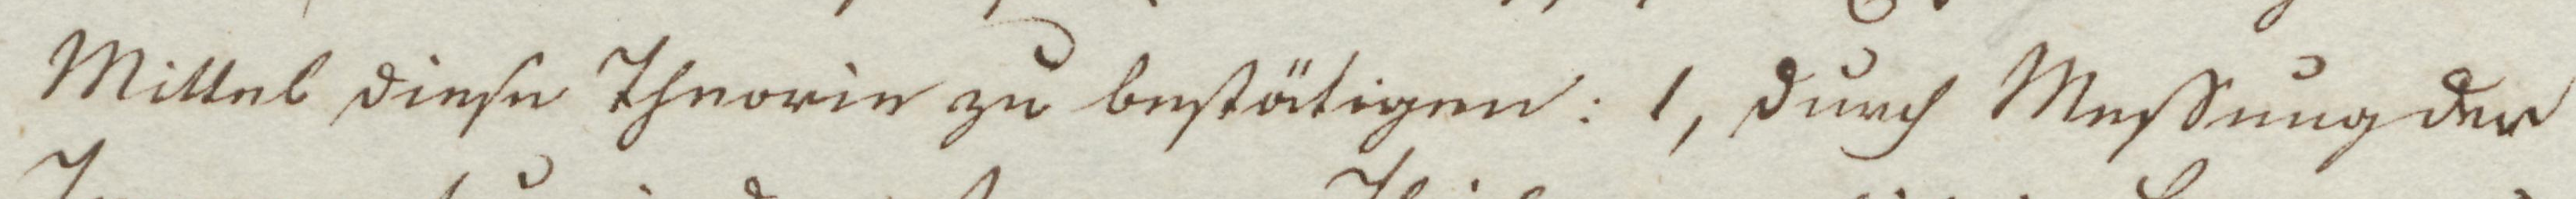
Mittel diese Theorie zu bestätigen: durch Messung der
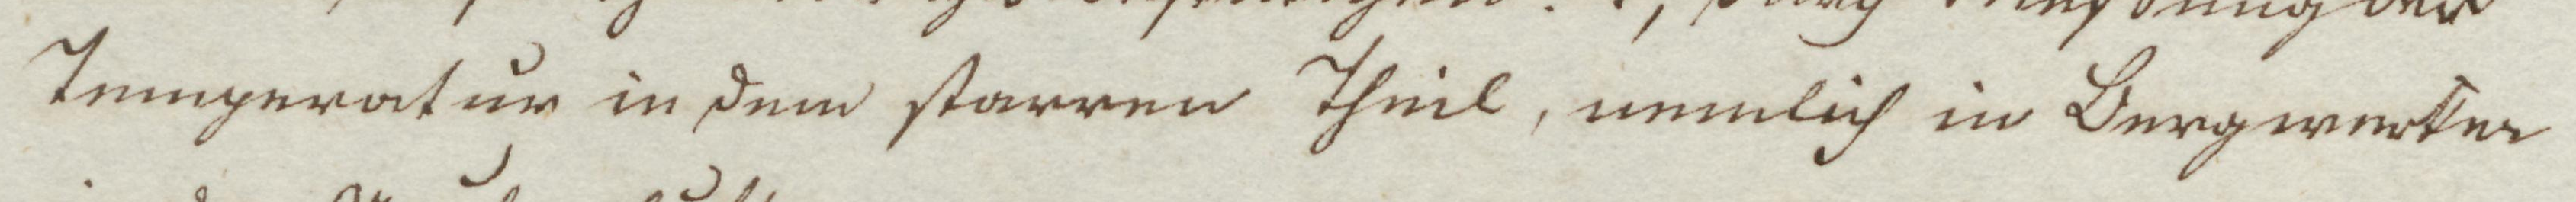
Temperatur in dem starren Theil, nemlich in Bergwerken
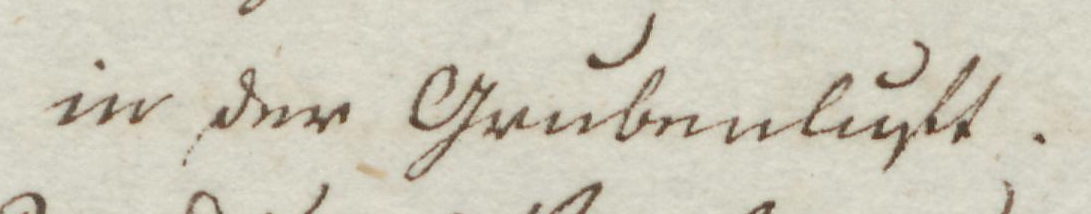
in der Grubenluft.
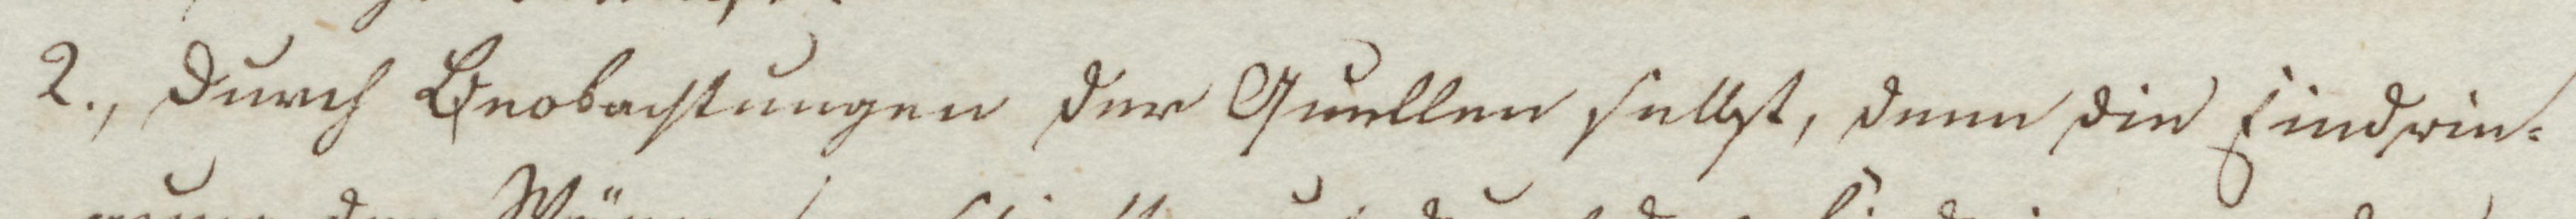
2., Durch Beobachtungen der Quellen selbst, denn die Eindrin-
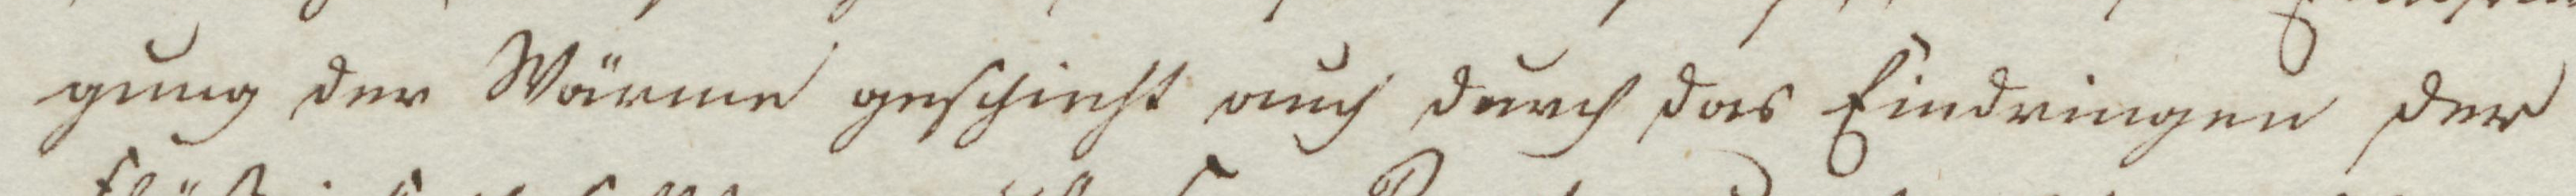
gung der Wärme geschieht auch durch das Eindringen der
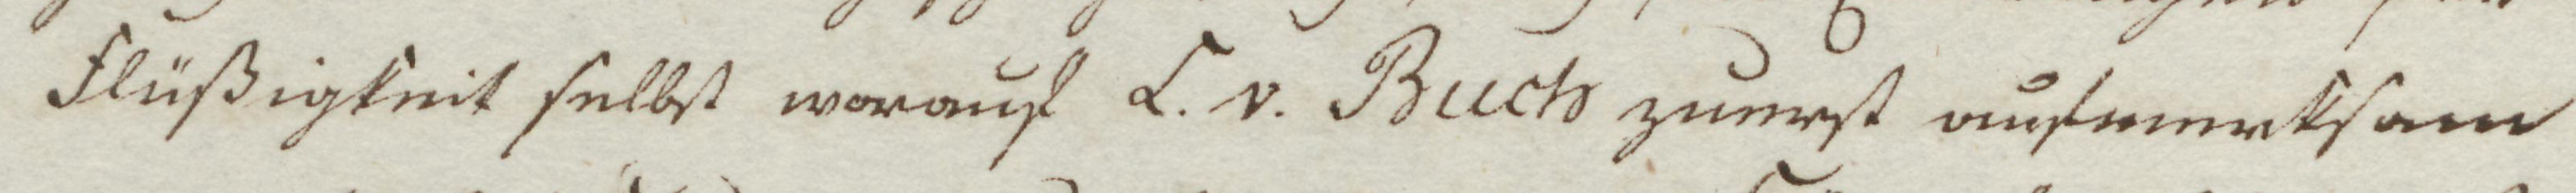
Flüßigkeit selbst worauf L. v. Buch zuerst aufmerksam
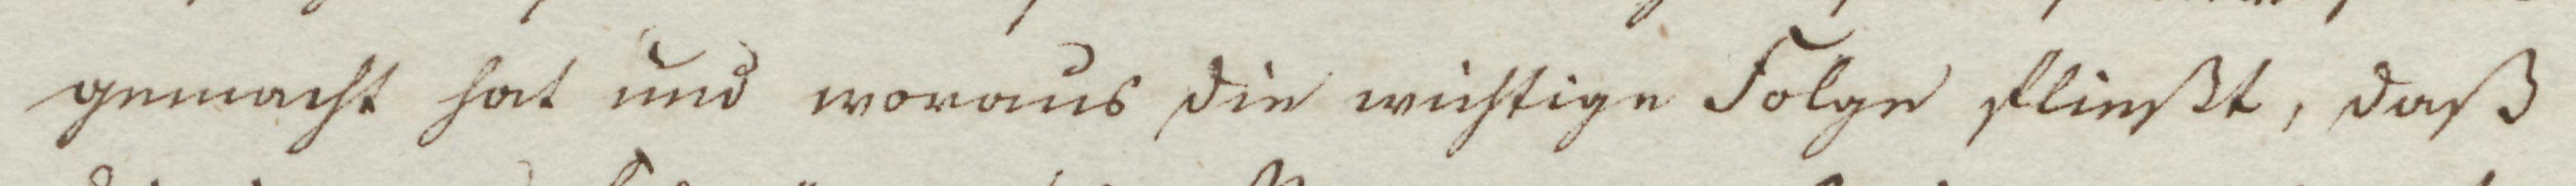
gemacht hat und woraus die wichtige Folge fließt, daß
